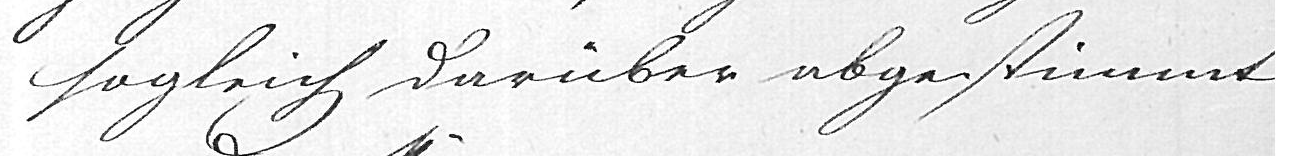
sogleich darüber abgestimmt
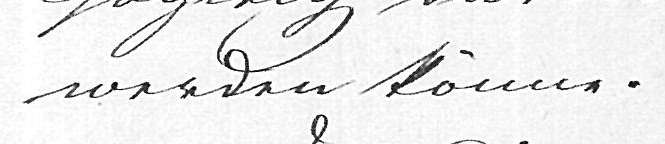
werden könne.
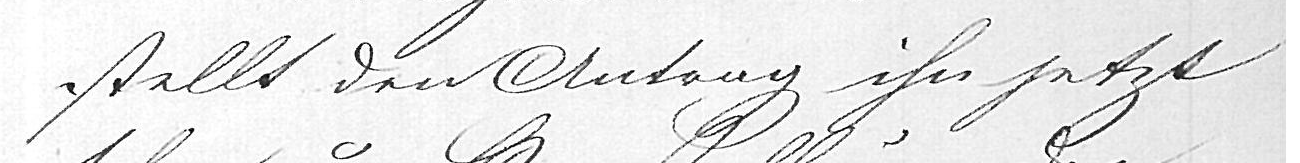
stellt den Antrag ihn jetzt
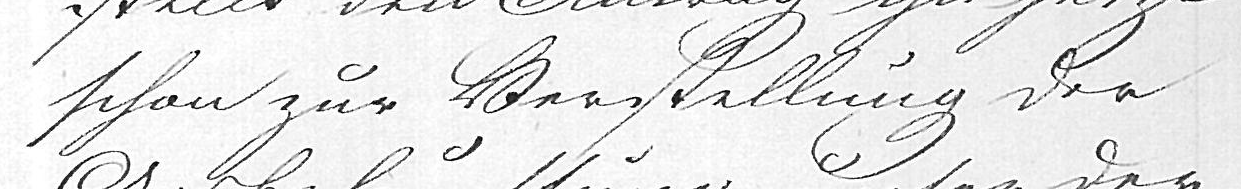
schon zur Herstellung der
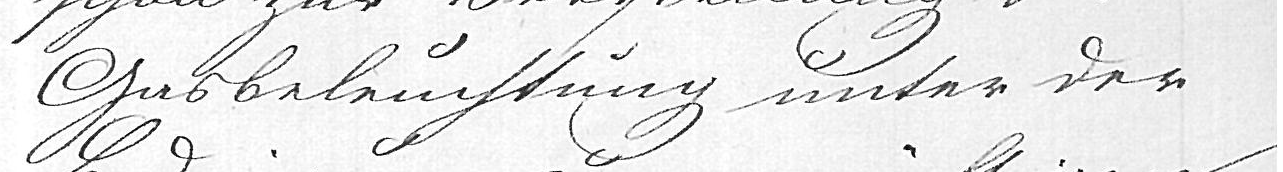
Gasbeleuchtung unter der
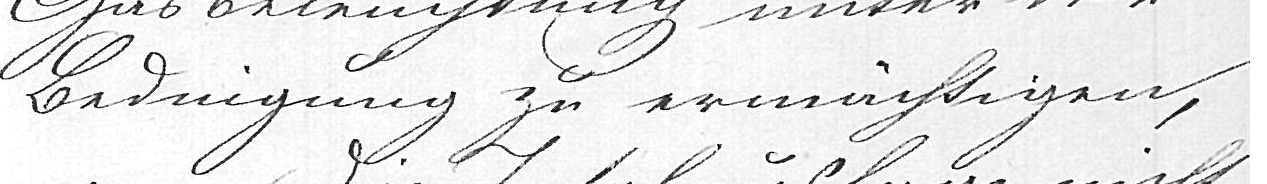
Bedingung ermächtigen,
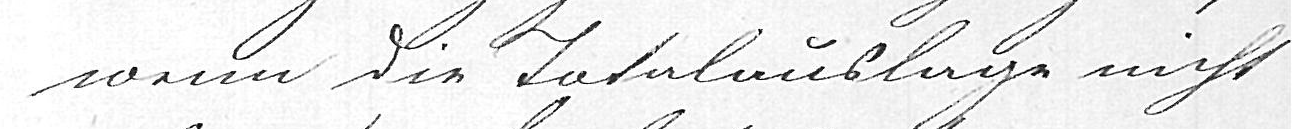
wenn die Totalauslage nicht
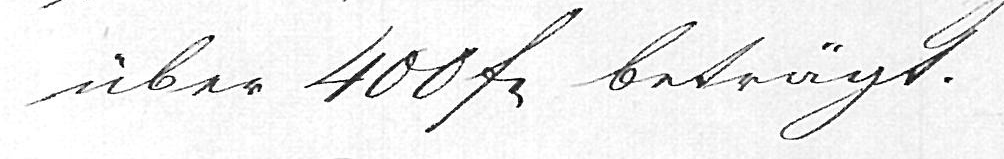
über 400 fl beträgt.
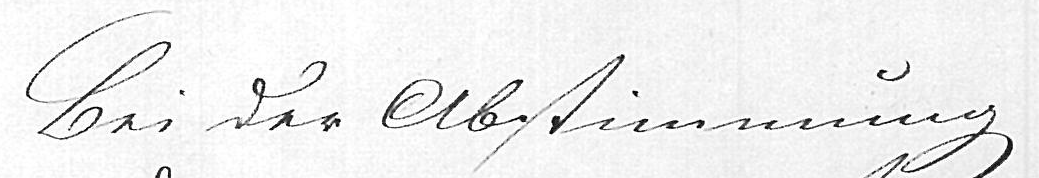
Bei der Abstimmung
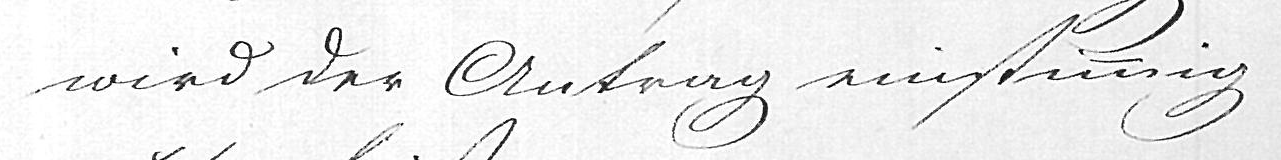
wird der Antrag einstimmig
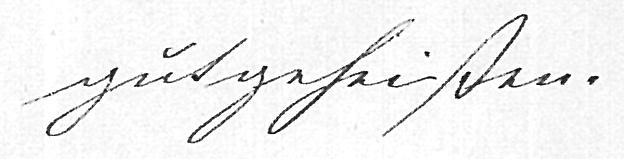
gutgeheißen.
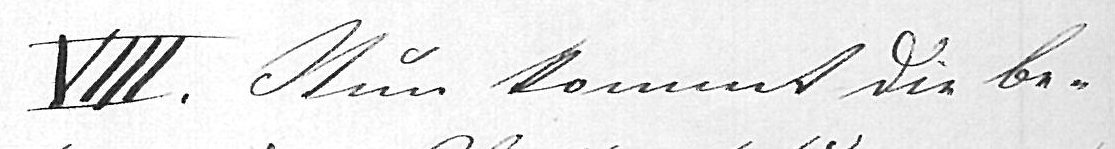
VIII. Nun kommt die be-
